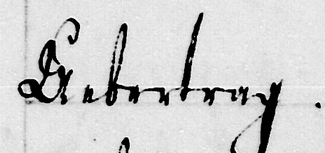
Uebertrag
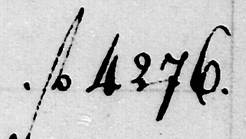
fl. 4276.
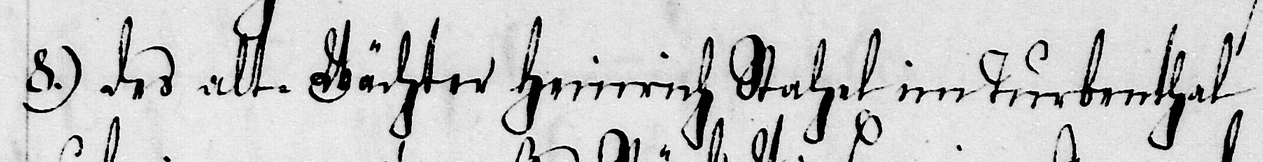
8.) des alt-Wächter Heinrich Stahel im Turbenthal
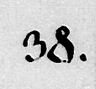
3000.
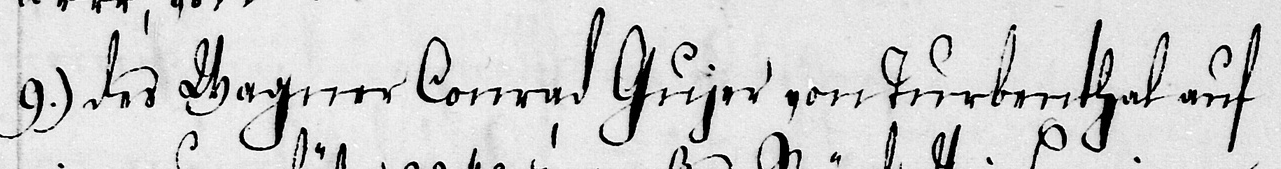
9.) des Wagner Conrad Gujer von Turbenthal auf
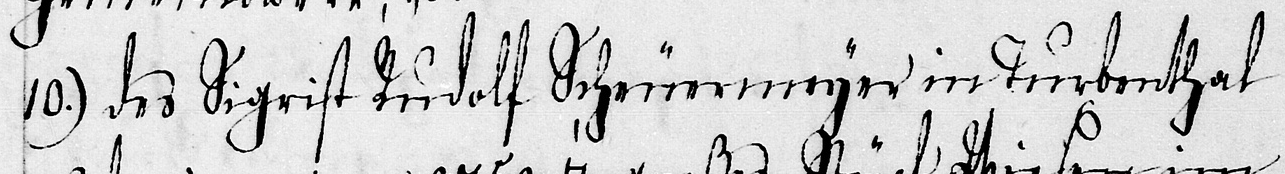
10.) des Sigrist Rudolf Scheuermeyer in Turbenthal
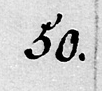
50.
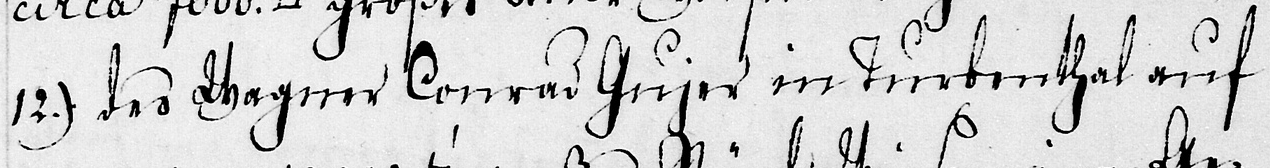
12.) des Wagner Conrad Gujer in Turbenthal auf
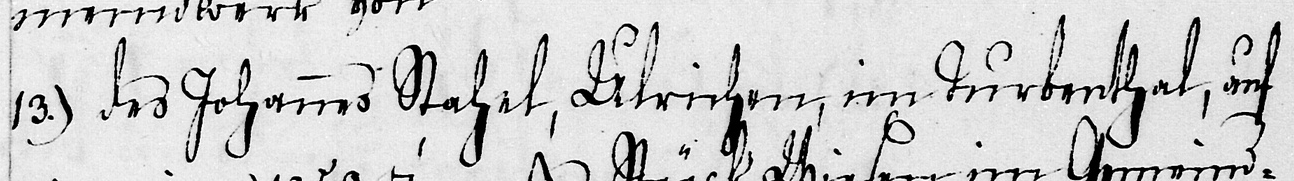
13.) des Johannes Stahel, Ulrichen, im Turbenthal, auf
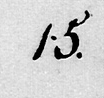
15.
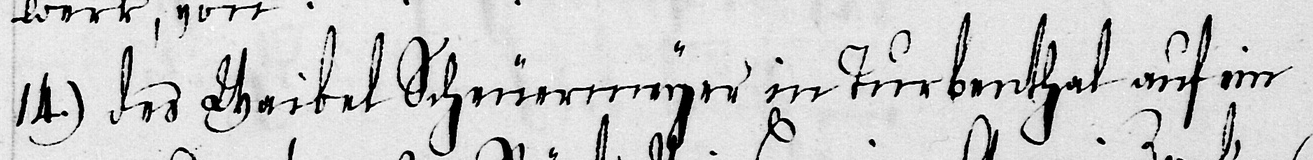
14.) des Waibel Scheuermeyer in Turbenthal auf ein
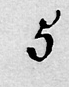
5.
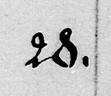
28.
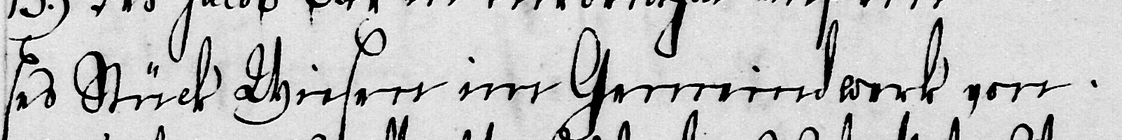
ßes Stück Wiesen im Gemeindwerk von
